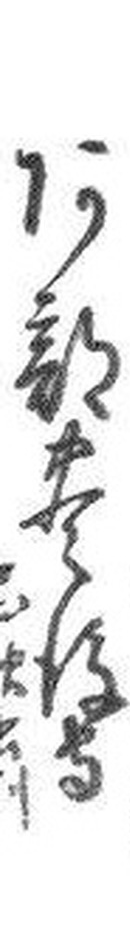阿部豊後守
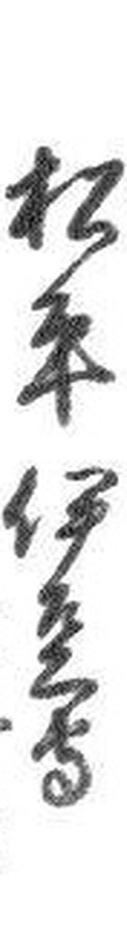松平伊豆守
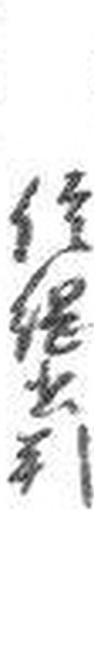信綱書判
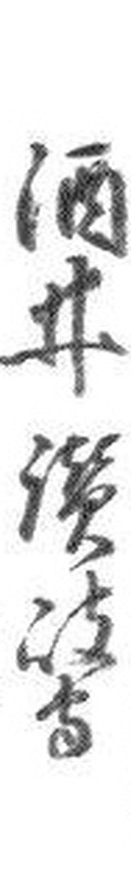酒井讃岐守
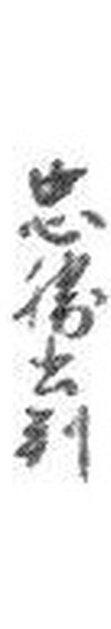忠勝書判
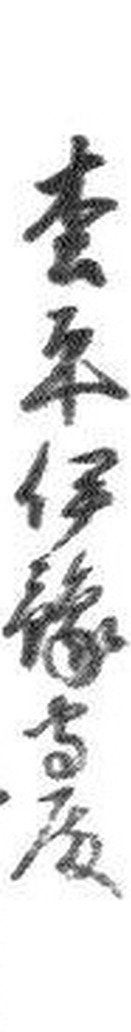松平伊予守殿
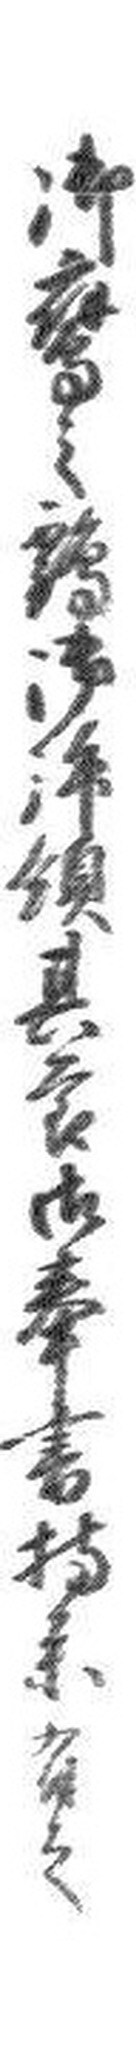御鷹之鶴御拝領其節御奉書持参有之
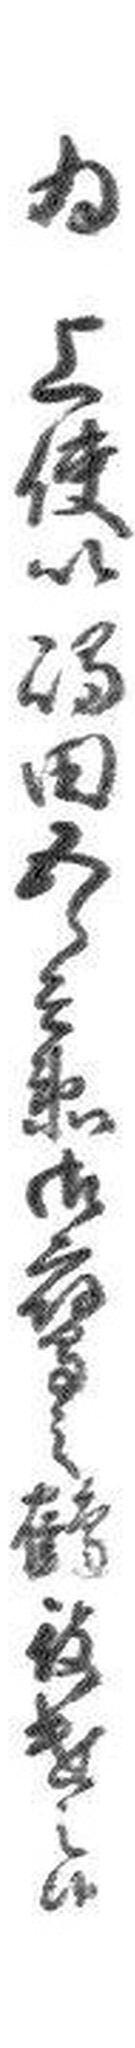為上使以嶋田五郎兵衛御鷹之鶴被遣之候
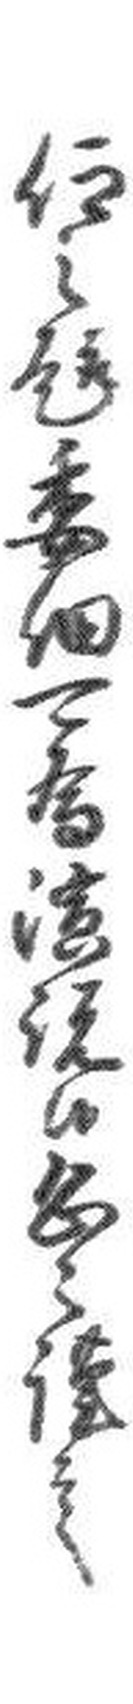仰之趣委細可為演説候恐々謹言

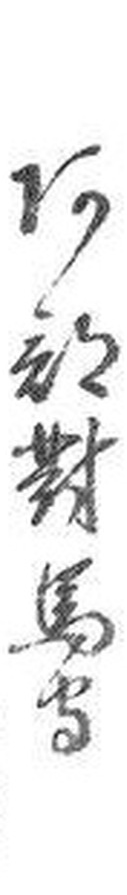阿部対馬守
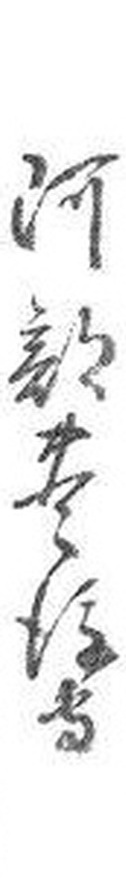阿部豊後守
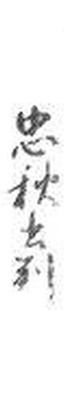忠秋書判
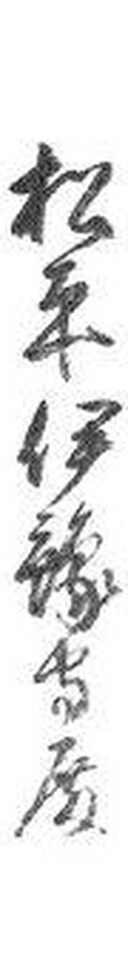松平伊予守殿
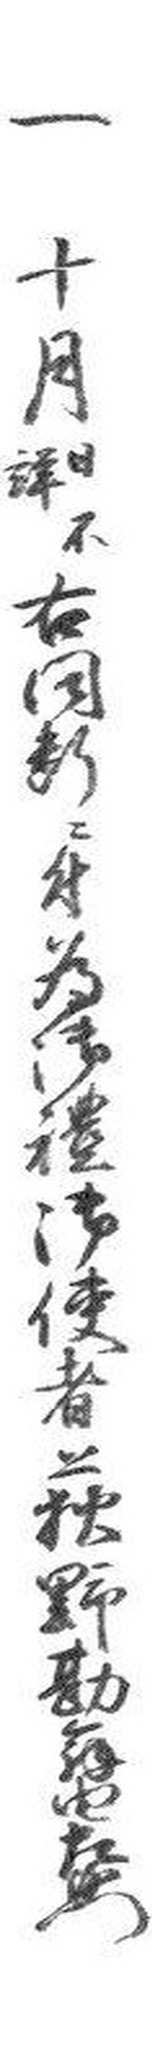一十月日不詳右同断ニ付為御礼御使者萩野勘解由左衛門
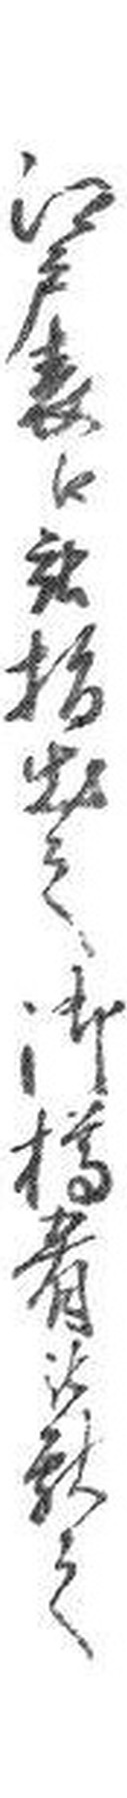江戸表江被指出之御樽肴被献之
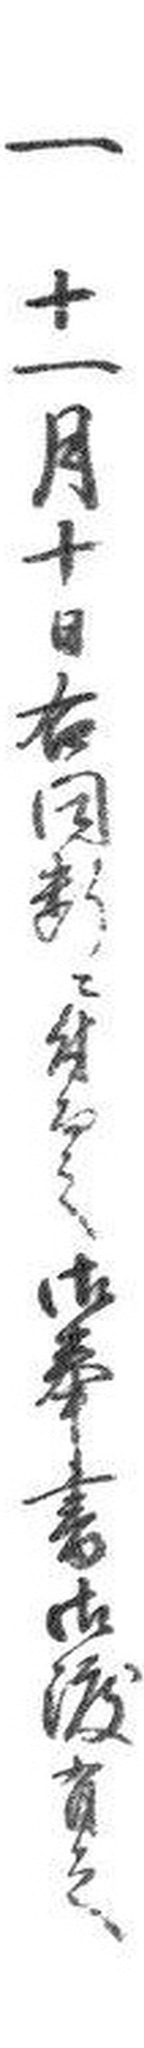一十一月十日右同断ニ付而之御奉書御渡有之
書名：家譜 四 忠昌公 従寛永七年到正保四年
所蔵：福井県文書館 Fukui Prefectural Archives
